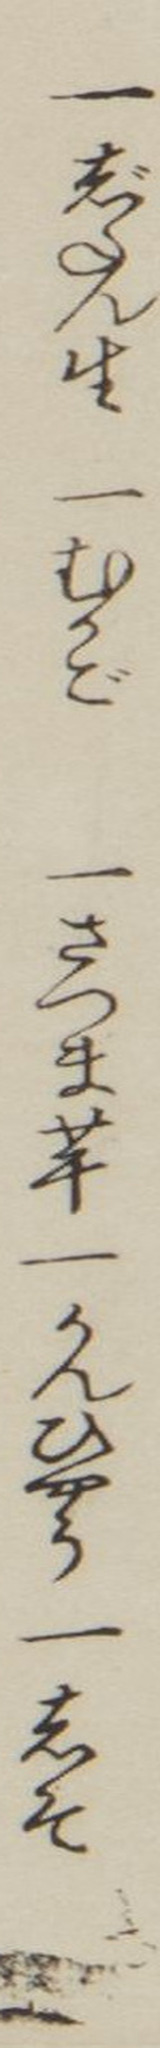一じねん生一むかご一さつま芋一かんひやう一しそ
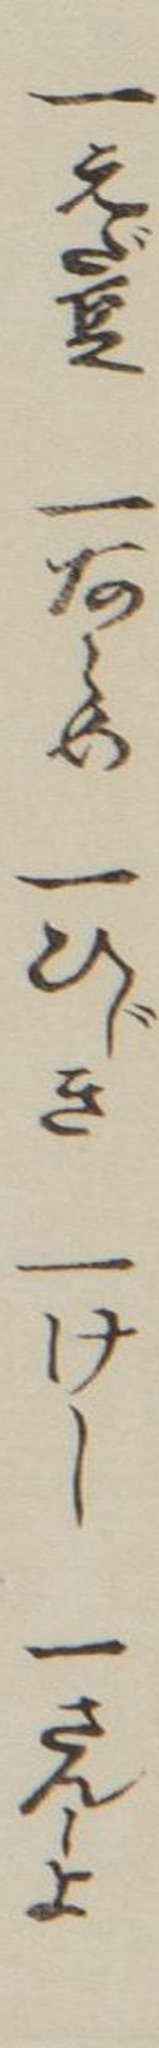一えだ豆一あらめ一ひじき一けし一さんしよ
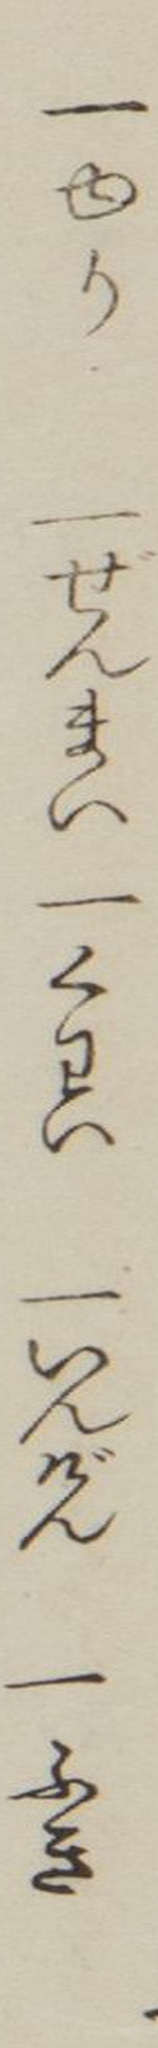一ゆり一ぜんまい一くわい一いんげん一ふき
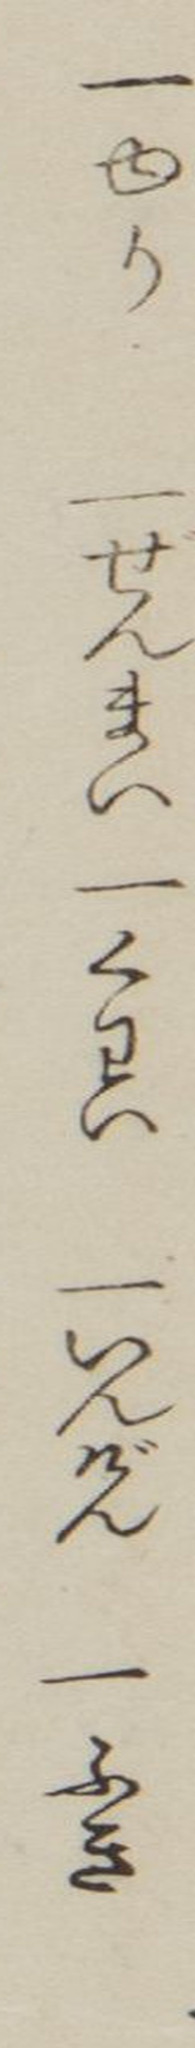一ゆり一ぜんまい一くわい一いんげん一ふき
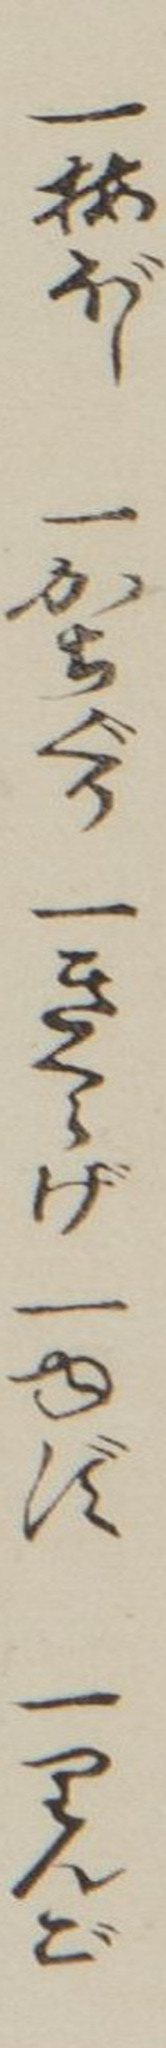一梅ぼし一かちぐり一きくらげ一ゆず一りんご
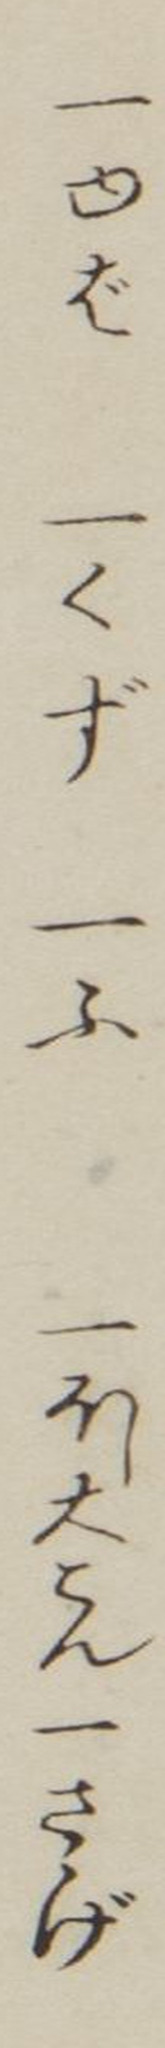一ゆば一くず一ふ一ほし大こん一さゝげ
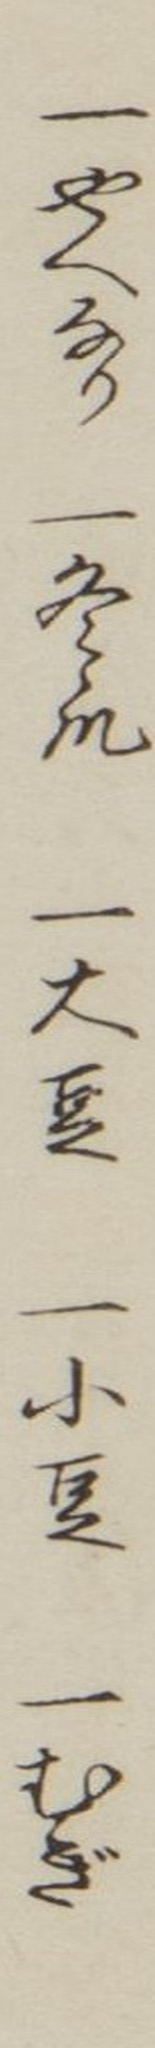一やへなり一冬瓜一大豆一小豆一むぎ
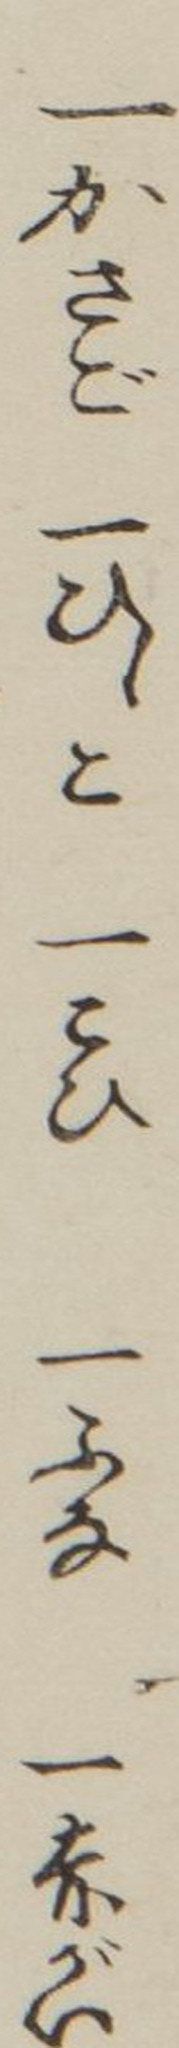一かさご一ひしこ一こひ一ふな一赤がい
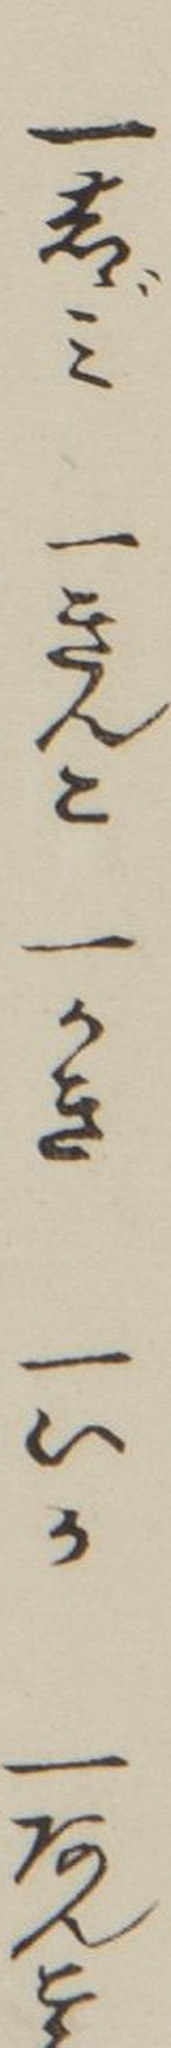一しじみ一きんこ一かき一いか一あんこう
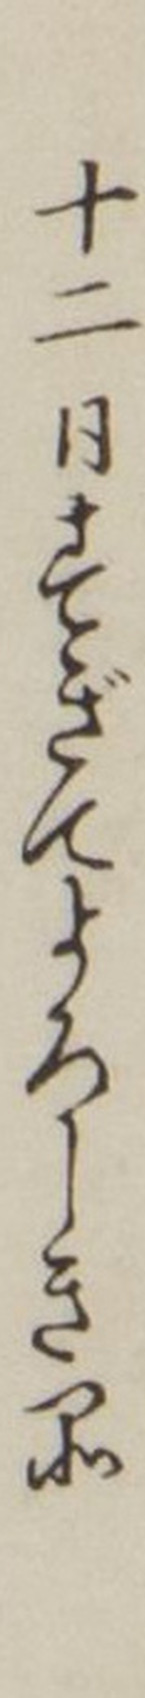十二日すぎてよろしき品
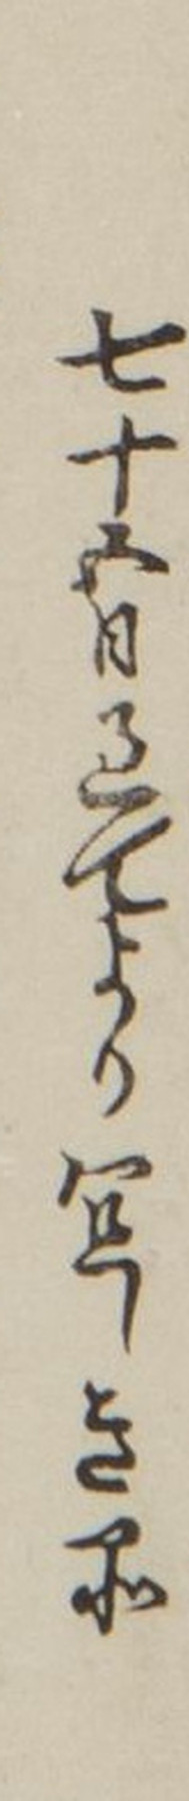七十五日過ぎてより宜しき品
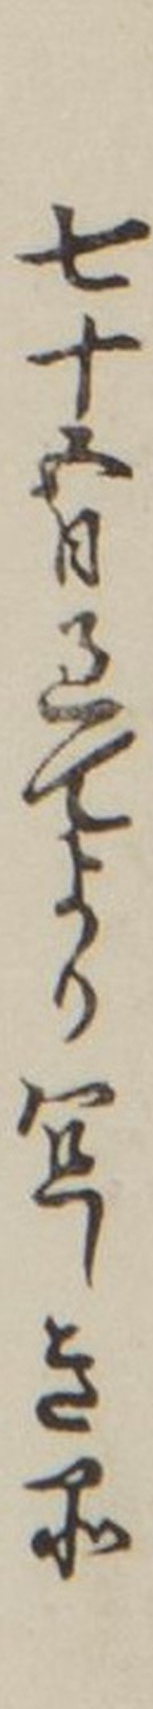七十五日過ぎてより宜しき品
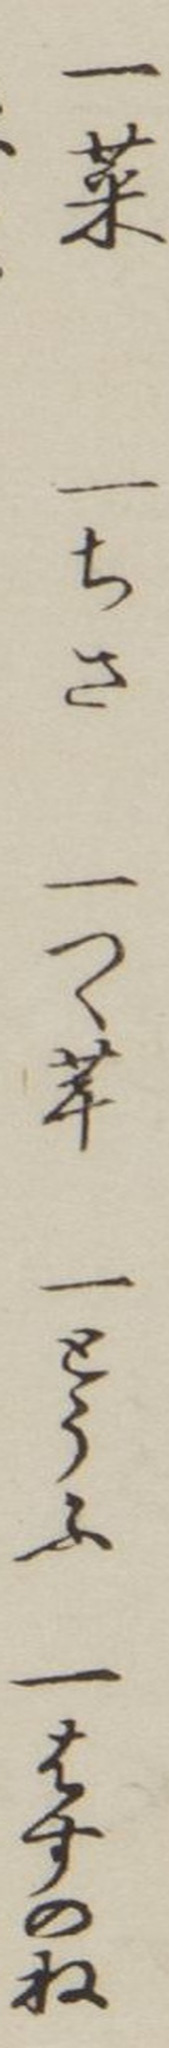一菜一ちさ一つく芋一とうふ一はすのね
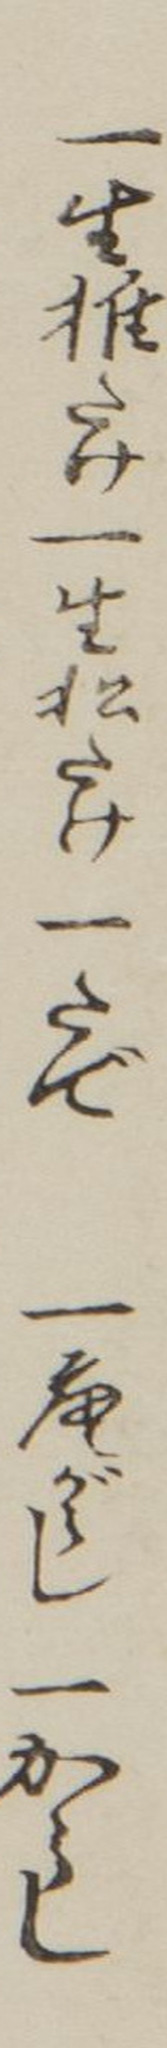一生椎たけ一生松たけ一たで一唐がらし一からし
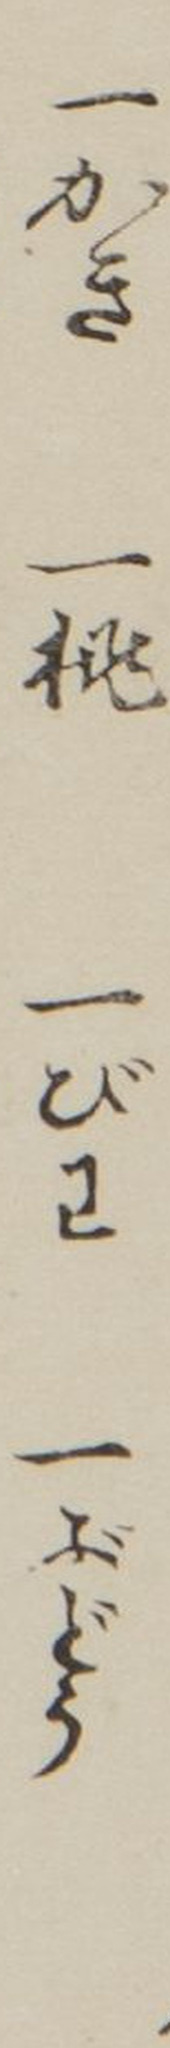一かき一桃一びわ一ぶどう
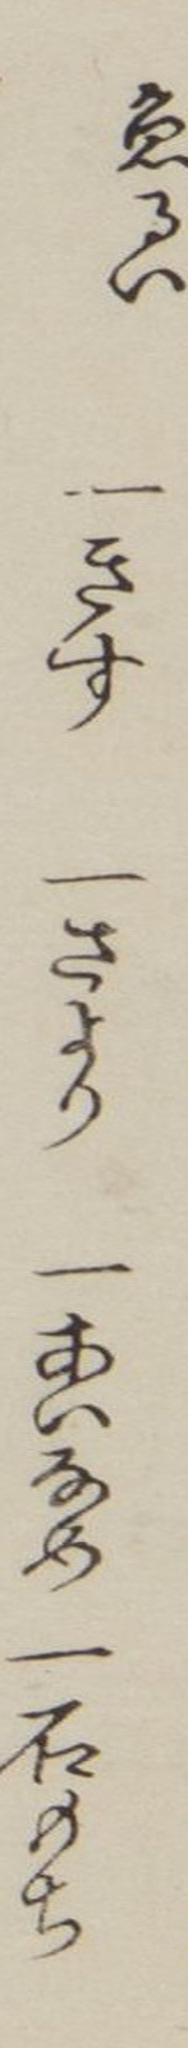魚るい一きす一さより一あいなめ一石もち
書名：はしか毒いみ心得艸
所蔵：あいおいニッセイ同和損保株式会社
